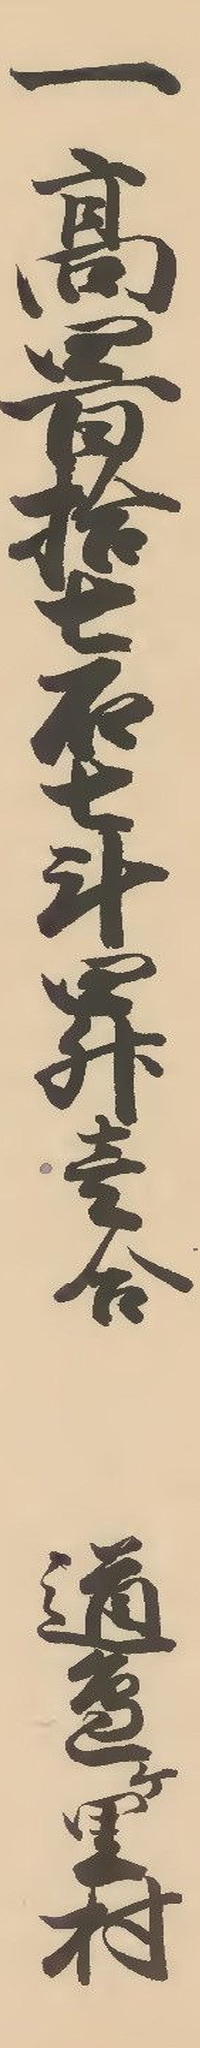一髙四百拾七石七斗四升壱合道邊ケ里村
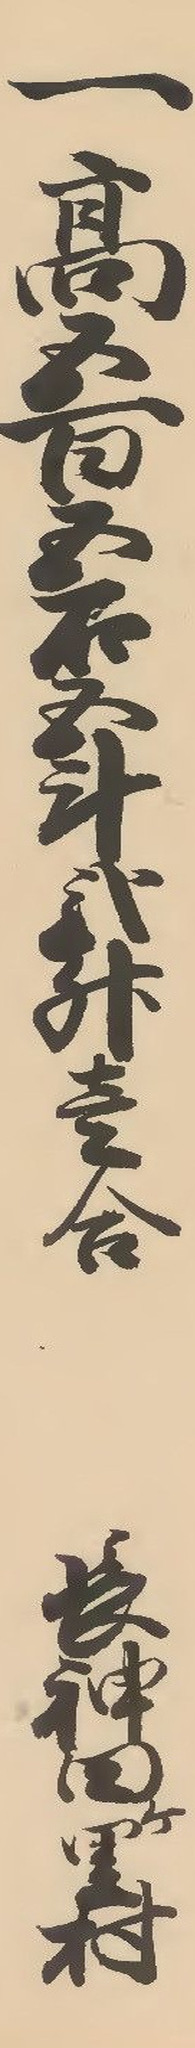一髙五百五石五斗弐升壱合長神田ケ里村
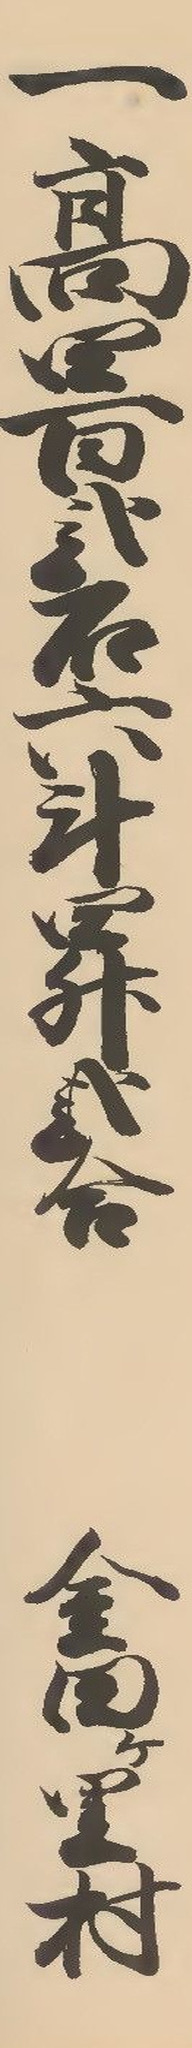一髙四百弐石六斗四升弐合金田ケ里村
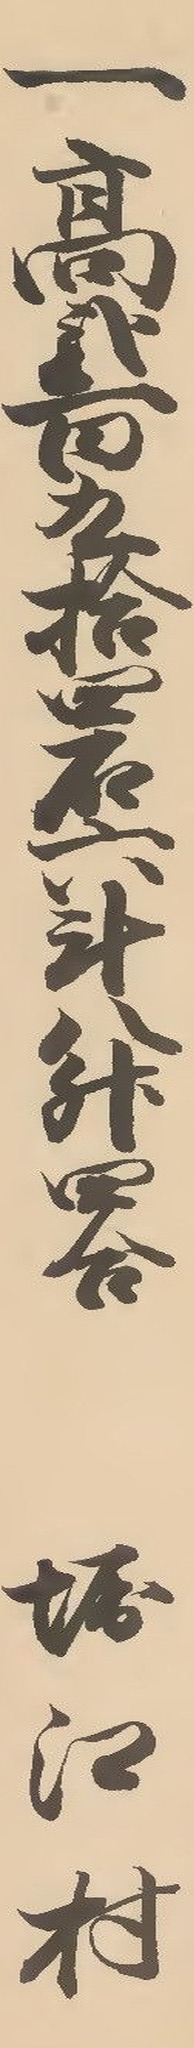一髙弐百九拾四石六斗八升四合堀江村
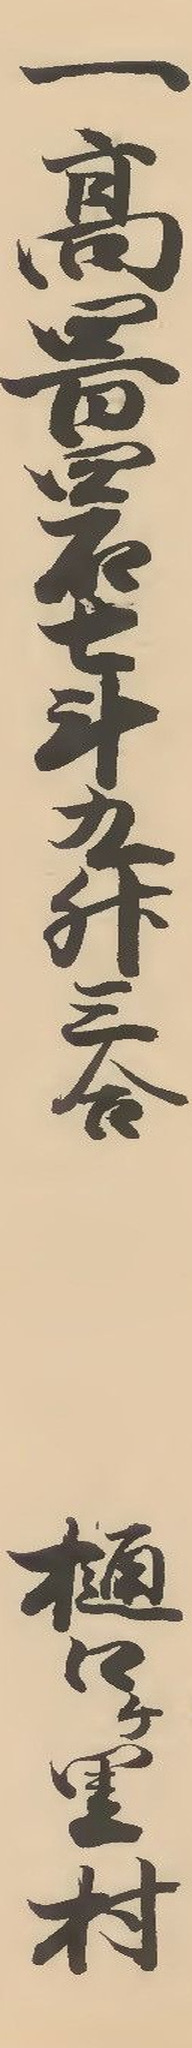一髙四百四石七斗九升三合樋口ケ里村
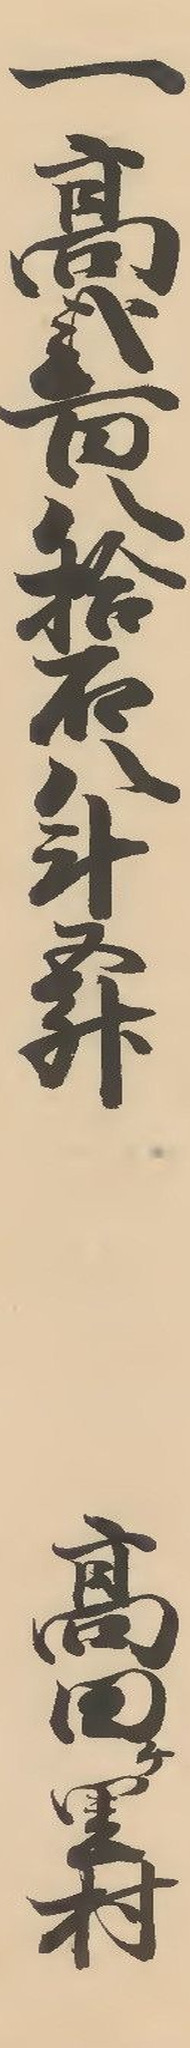一髙弐百八拾石八斗五升髙田ケ里村
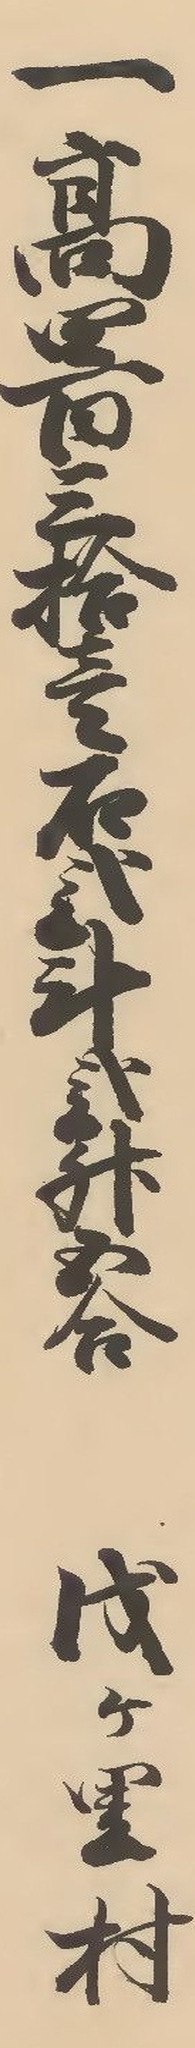一髙四百三拾壱石弐斗弐升五合戊ケ里村

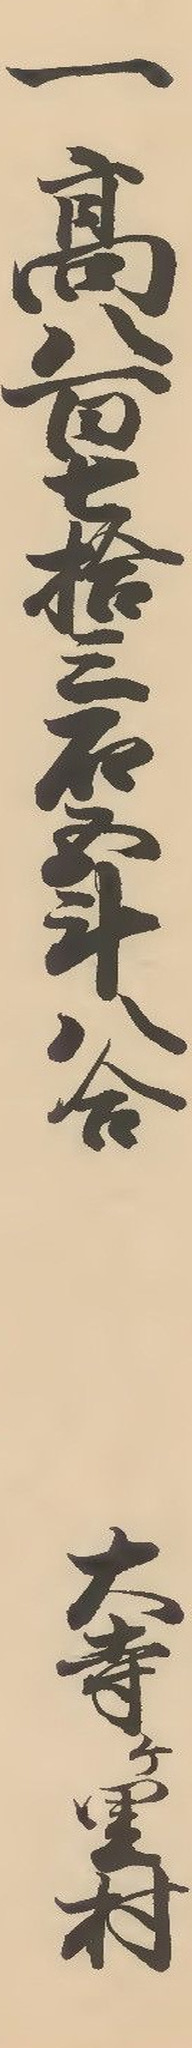一髙八百七拾三石五斗八合大寺ケ里村
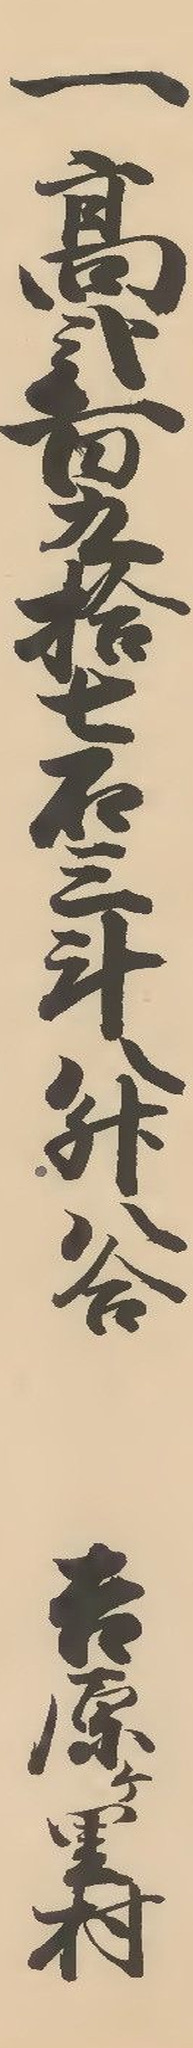一髙弐百九拾七石三斗八升八合吉原ケ里村
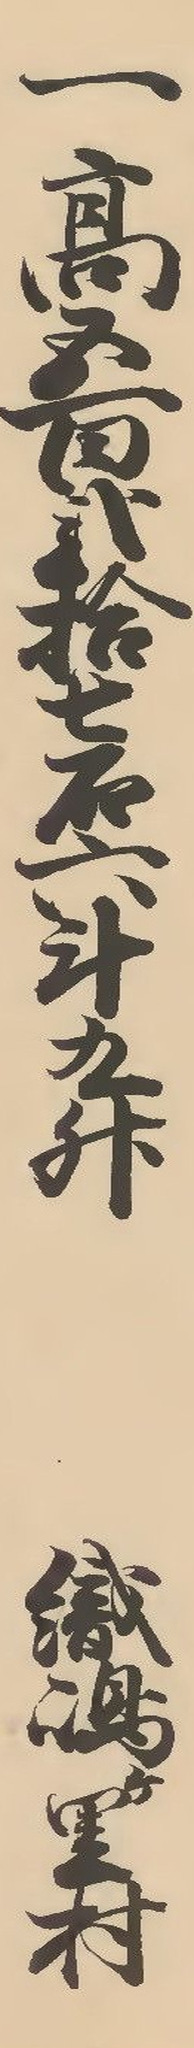一髙五百弐拾七石六斗九升織嶋ケ里村
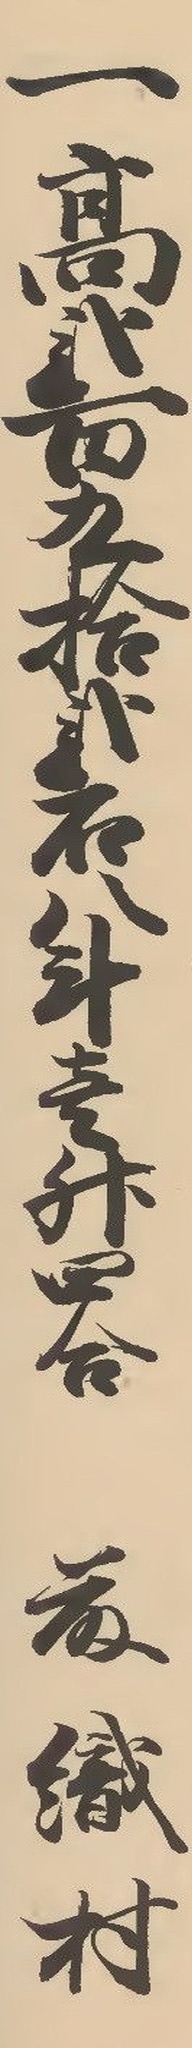一髙弐百九拾弐石八斗壱升四合藤織村
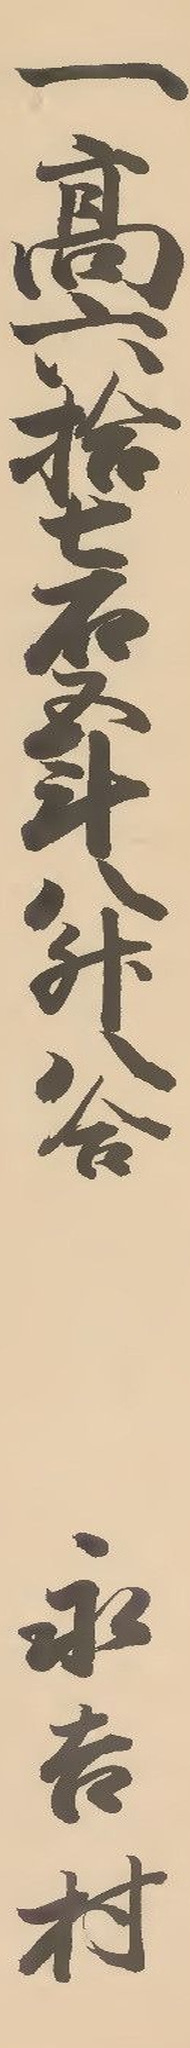一髙六拾七石五斗八升八合永吉村
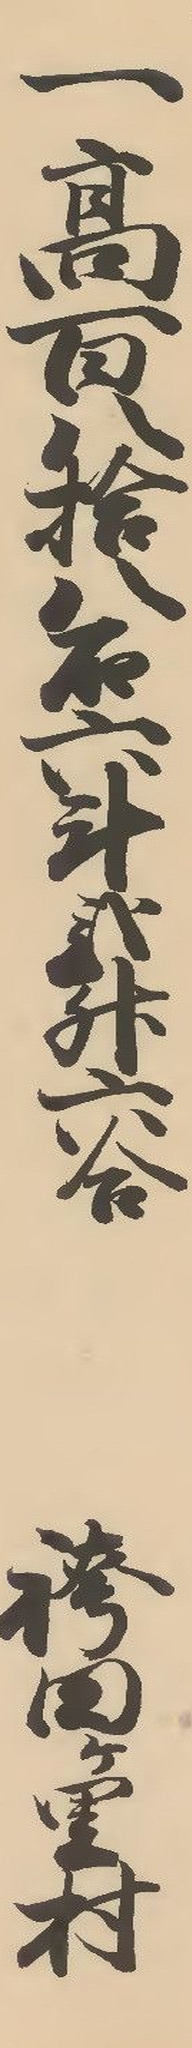一髙百八拾八石六斗弐升六合袴田ケ里村
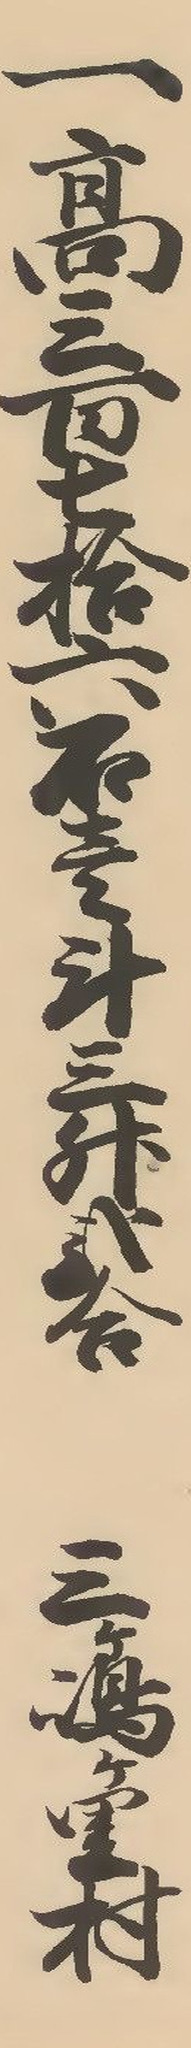一髙三百七拾六石壱斗三升弐合三ケ嶋ケ里村
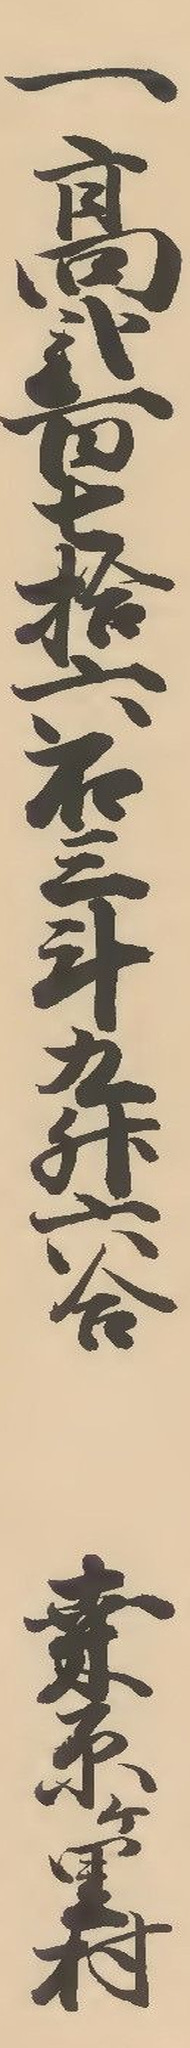一髙弐百七拾六石三斗九升六合桑原ケ里村

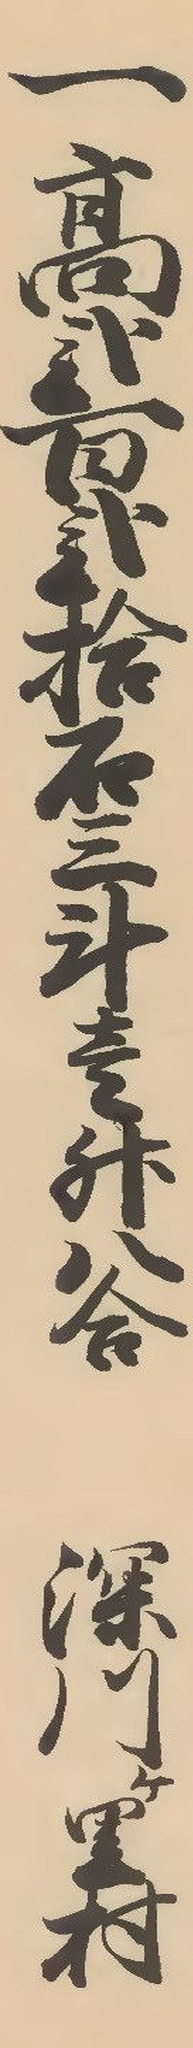一髙弐百弐拾石三斗壱升八合深川ケ里村
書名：肥前国郷帳
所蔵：国立公文書館 National Archives of Japan
